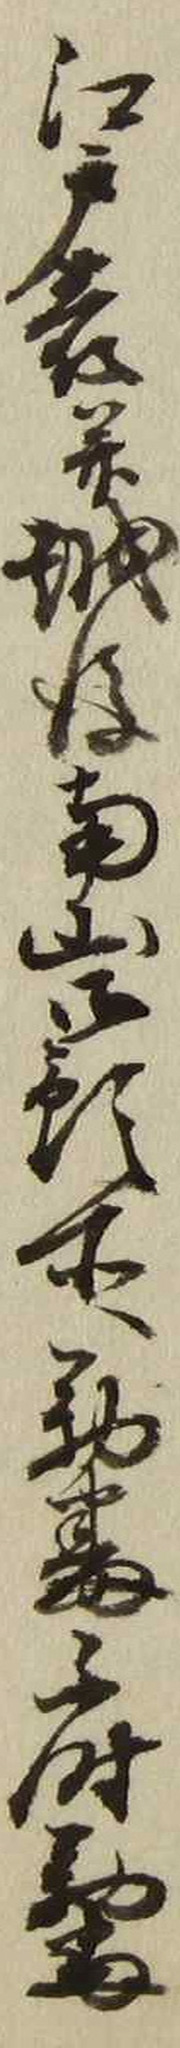江戸表并越後南山御預所へ勤番不時勤番

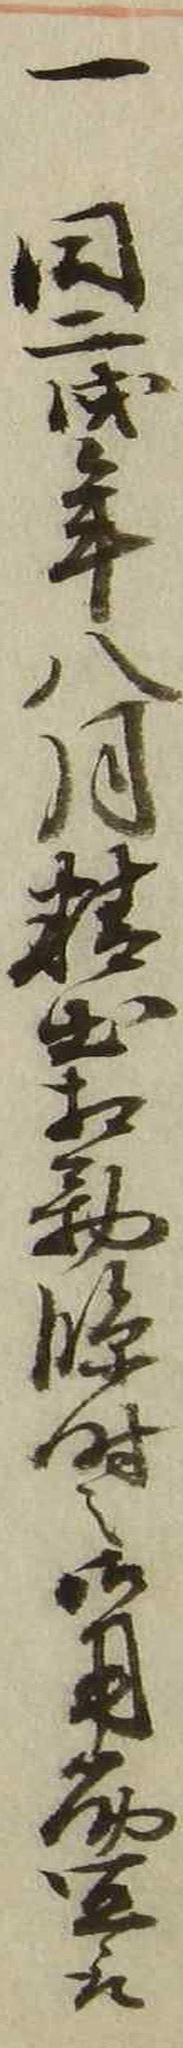一同二戌年八月精出相勤臨時之御用筋宜被
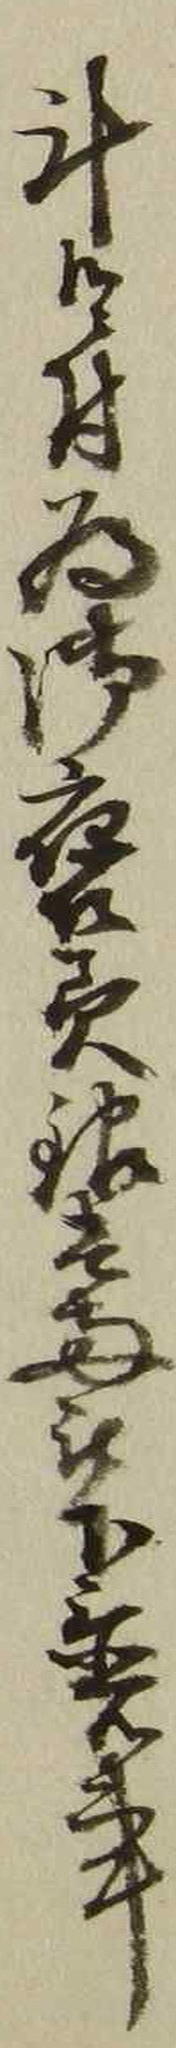計候に付為御褒美銀壱両被下置候事
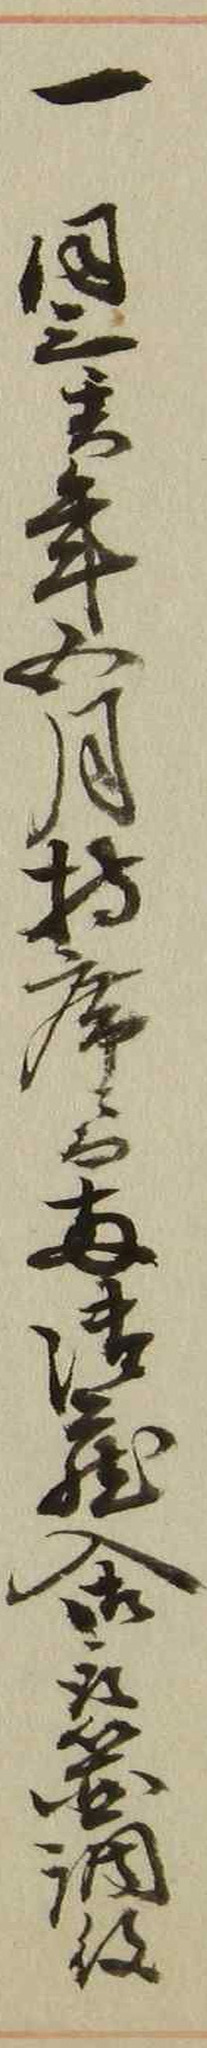一同三亥年五月持席に而両御蔵入御取箇調役
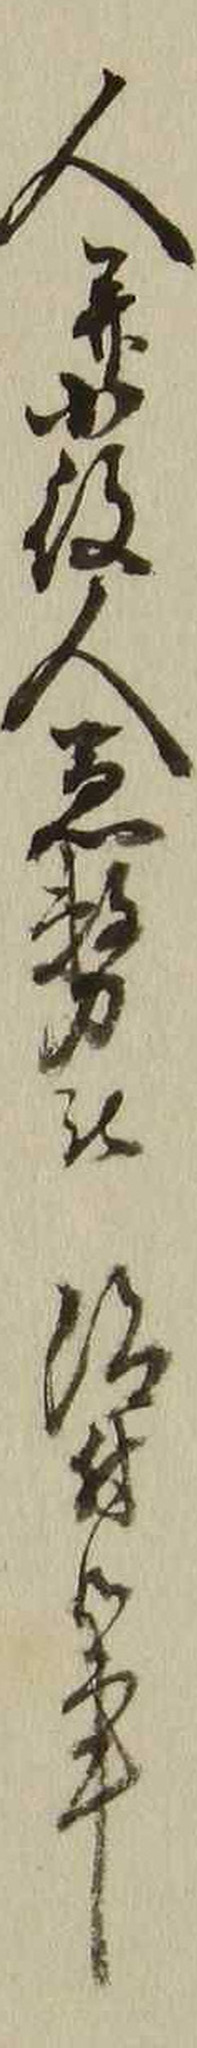人并小役人兼務被仰付候事
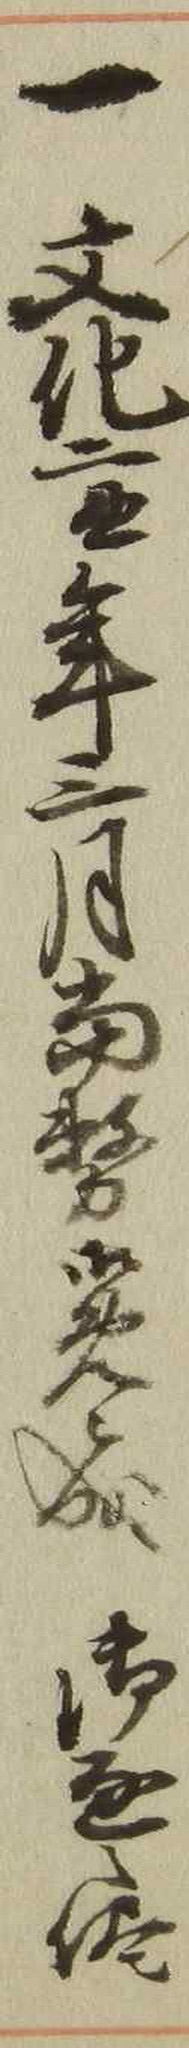一文化二丑年二月当務御免被成御通之侭
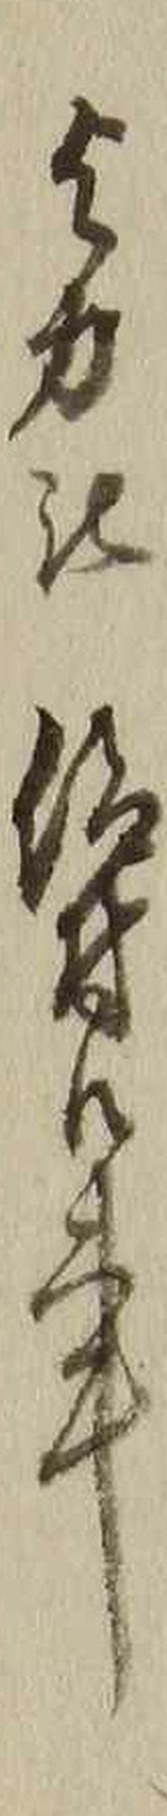与力被仰付候事
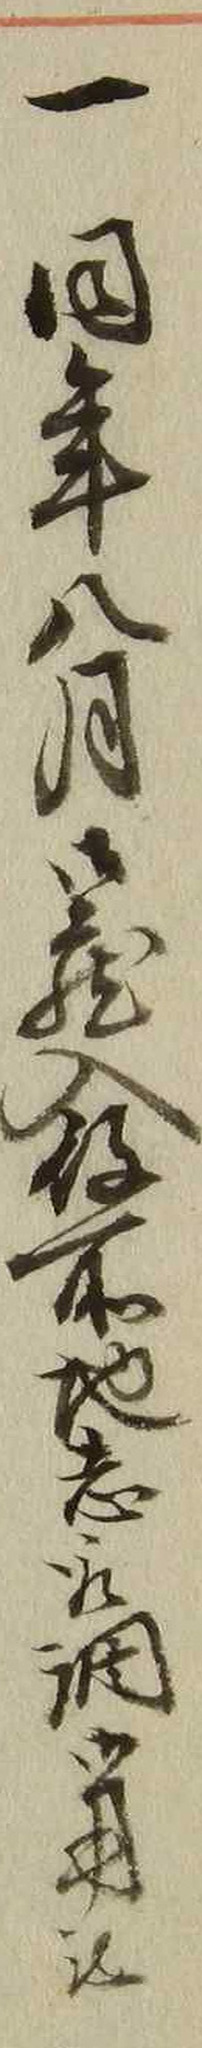一同年八月御蔵入役所地志取調御用被
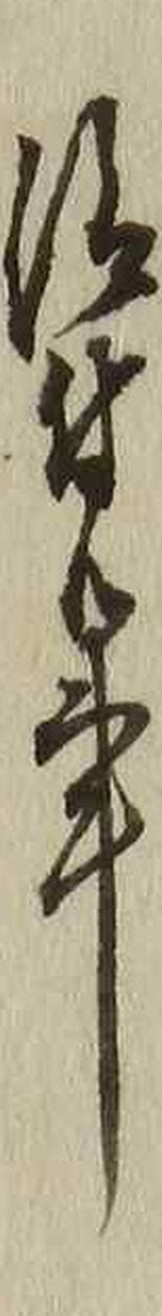仰付候事
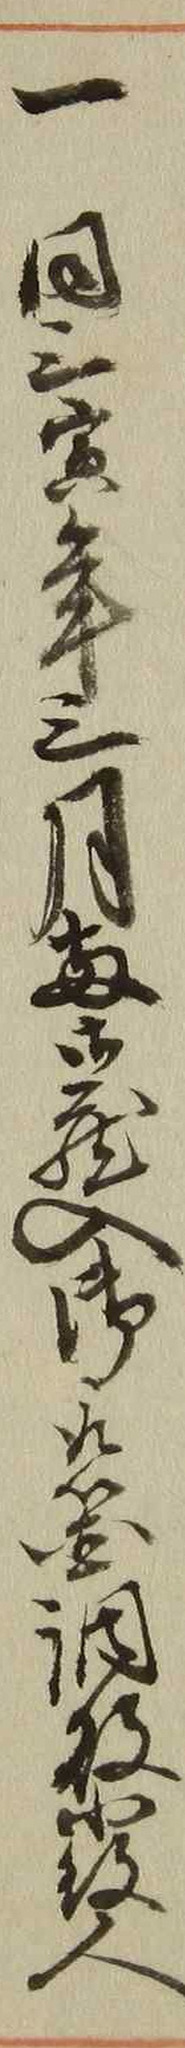一同三寅年三月両御蔵入御取箇調役小役人
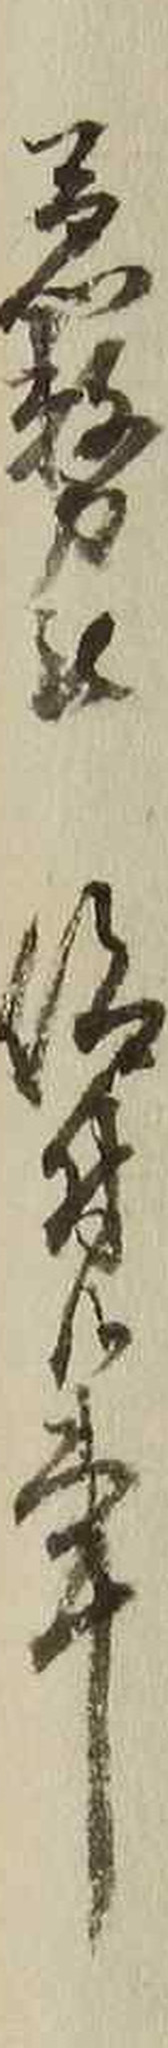兼務被仰付候事
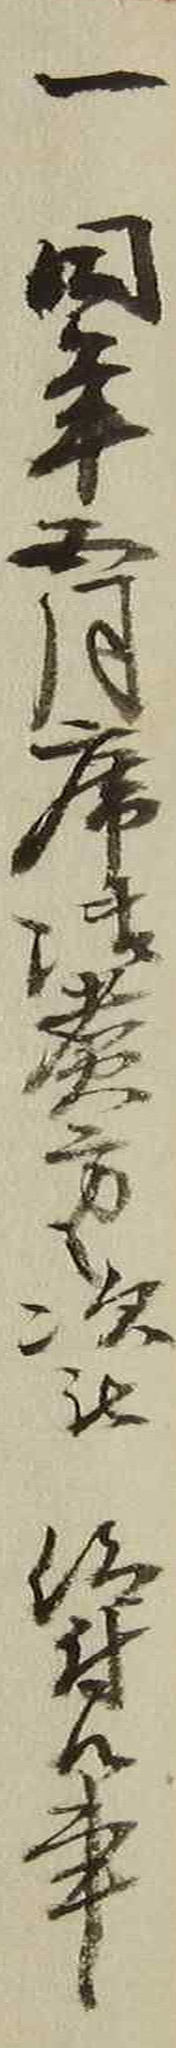一同年五月席御煮方之次被仰付候事
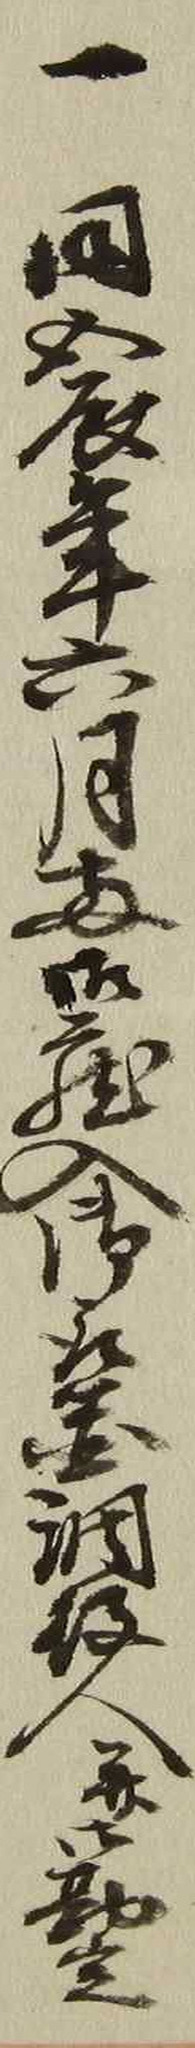一同五辰年六月両御蔵入御取箇調役人并御勘定
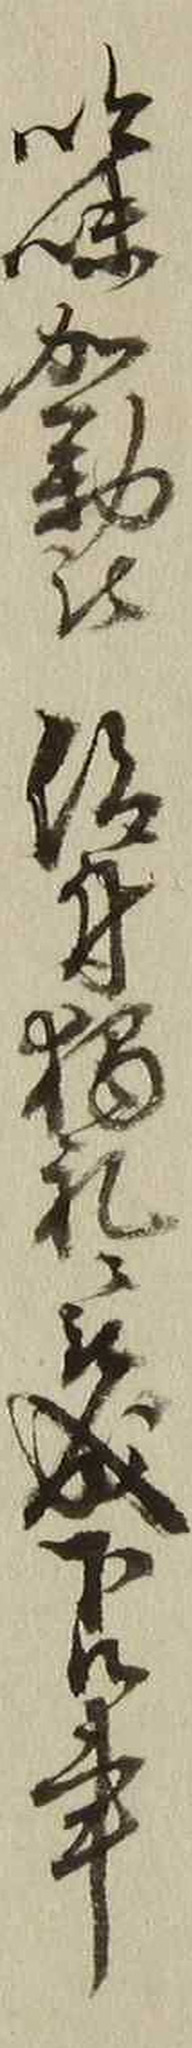吟味加勤被仰付独礼に被成下候事
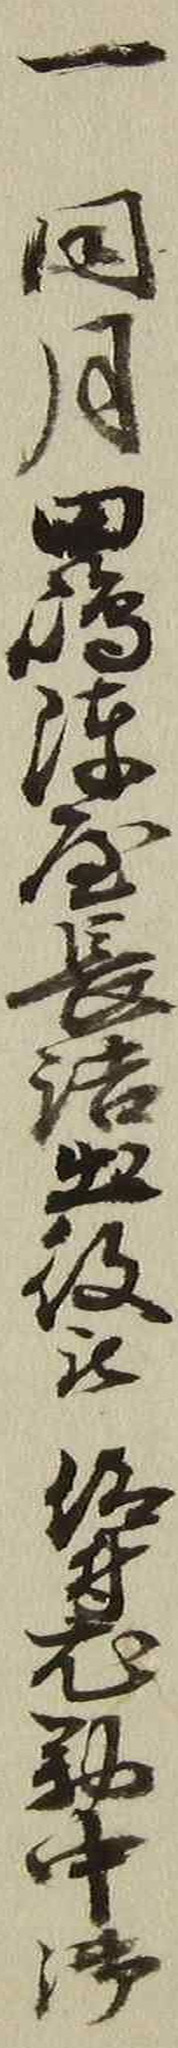一同月田島陣屋長詰出役被仰付尤勤中御
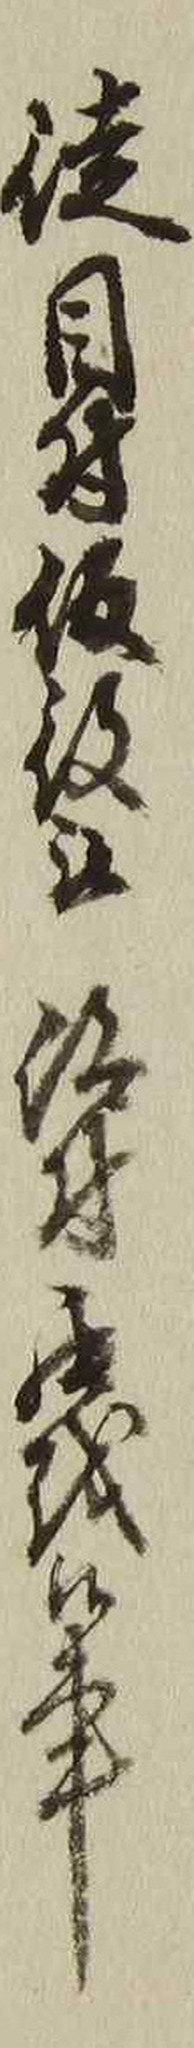徒目付仮役被仰付罷越候事
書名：諸士系譜　巻之38　は之部6
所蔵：会津若松市立会津図書館
